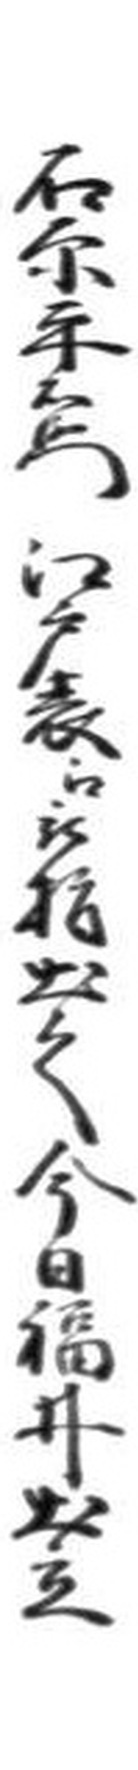石原平右衛門江戸表江被指出之今日福井出立
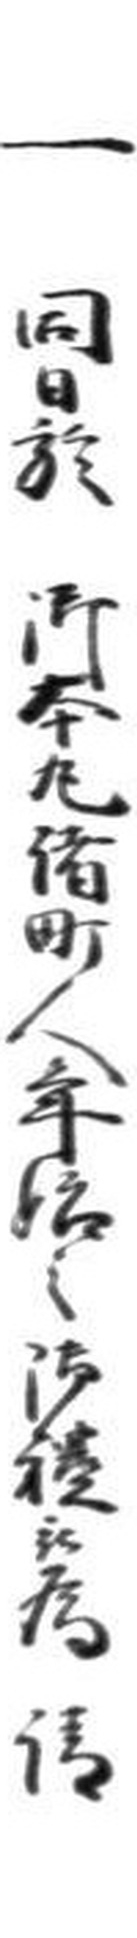一同日於御本丸諸町人年始之御礼被為請
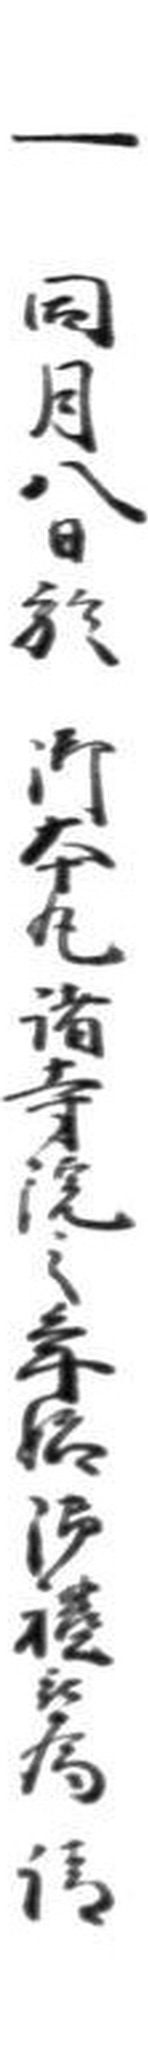一同月八日於御本丸諸寺院之年始御礼被為請
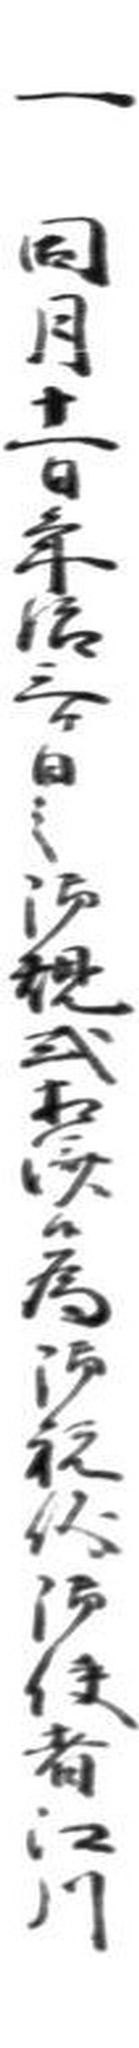一同月十一日年始三ヶ日之御規式相済候為御祝儀御使者江川
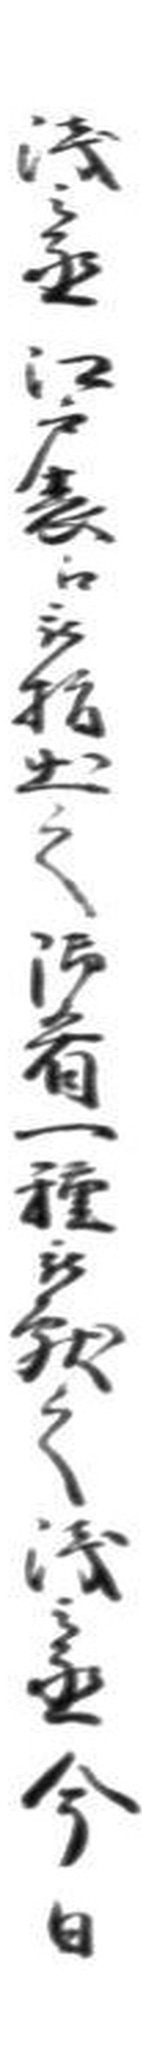浅之丞江戸表江被指出之御肴一種被献之浅之丞今日
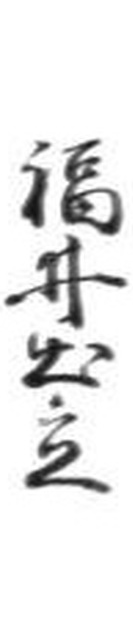福井出立

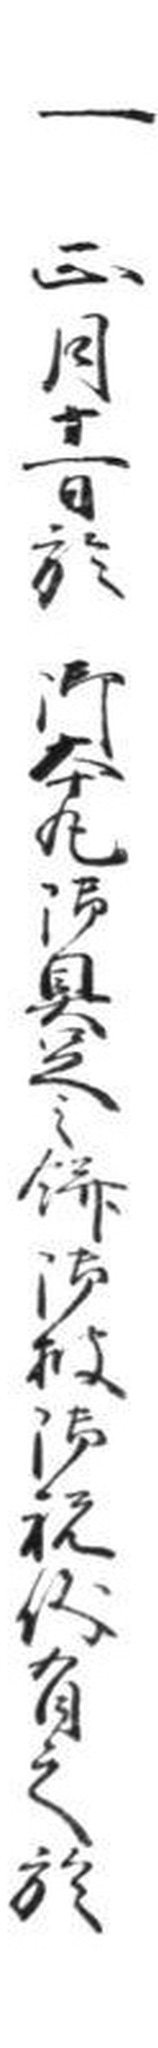一正月十一日於御本丸御具足之餅御披御祝儀有之於
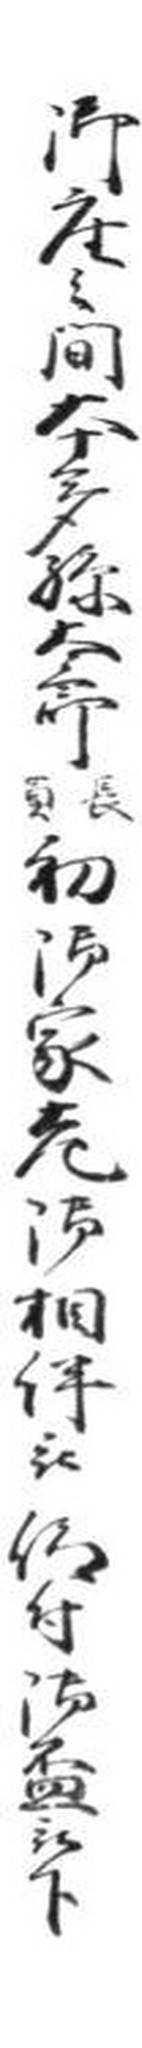御座之間本多孫太郎長員初御家老御相伴被仰付御盃被下
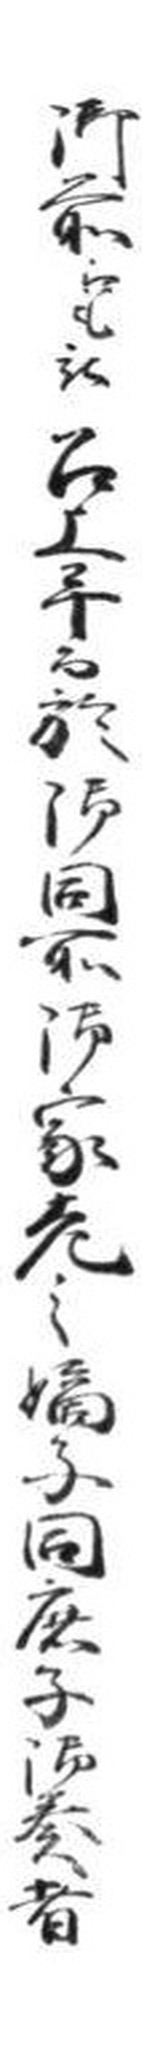御前江も被召上畢而於御同所御家老之嫡子同庶子御奏者
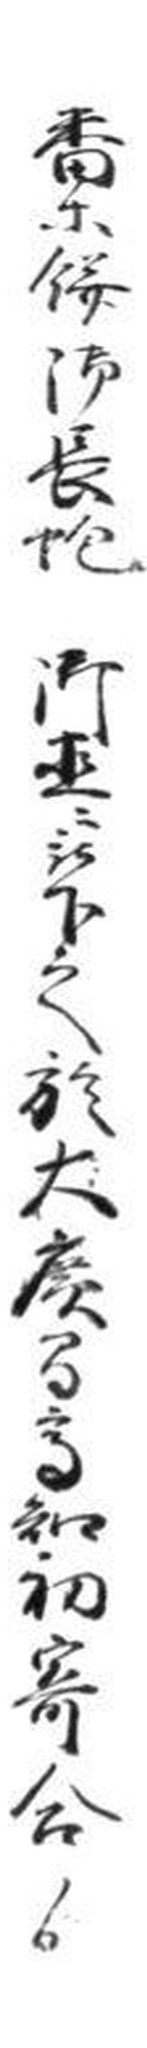番等餅御長蚫御直ニ被下之於大広間高知初寄合ゟ
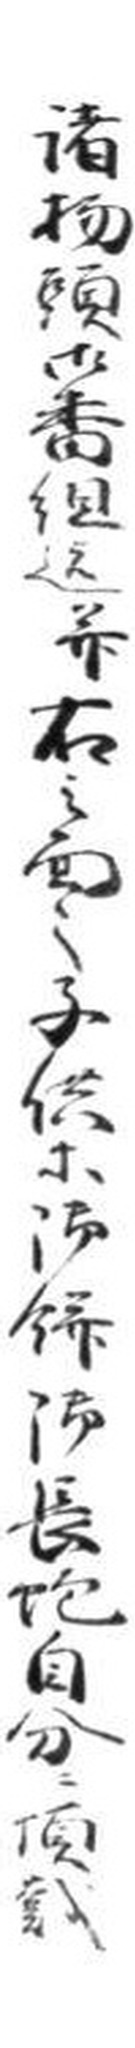諸物頭御番組迄右之面々子供等御餅御長蚫自分ニ頂戴
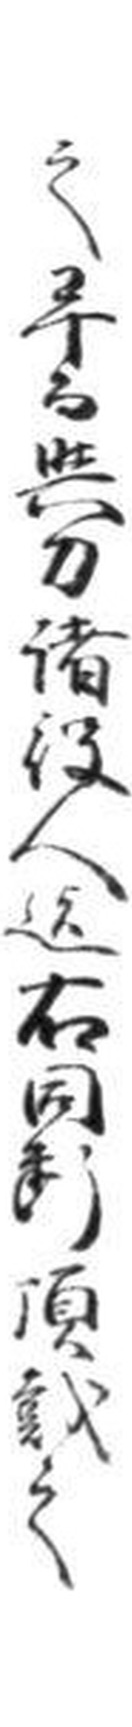之畢而与力諸役人迄右同断頂戴之
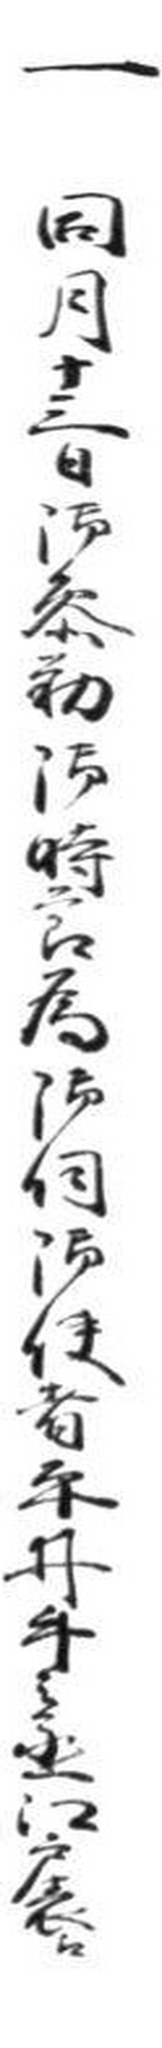一同月十三日御参勤御時節為御伺御使者平井牛之丞江戸表江
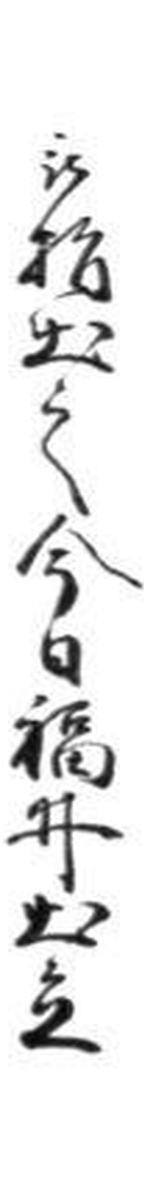被指出之今日福井出立
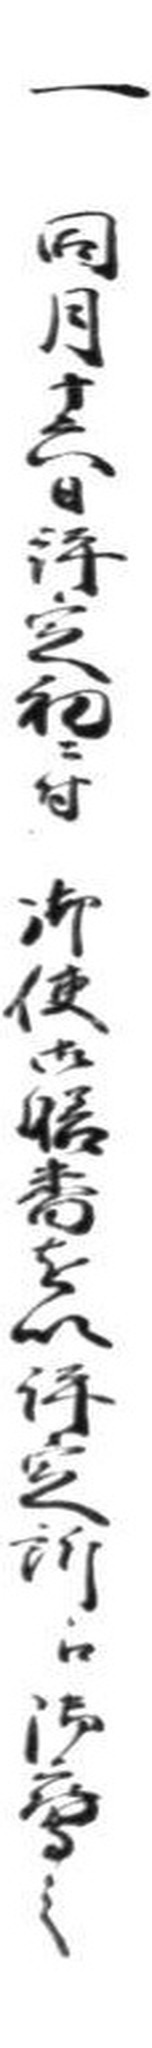一同月十六日評定初ニ付御使者御膳番を以評定所江御鷹之
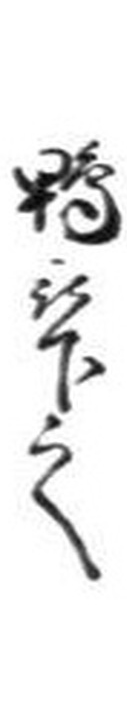鴨被下之
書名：家譜 十七 吉品公 従元禄元年到同二年
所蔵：福井県文書館 Fukui Prefectural Archives
